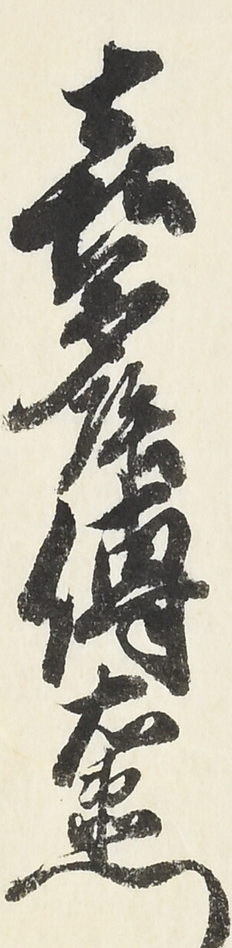喜多屋伝右衛門㊞
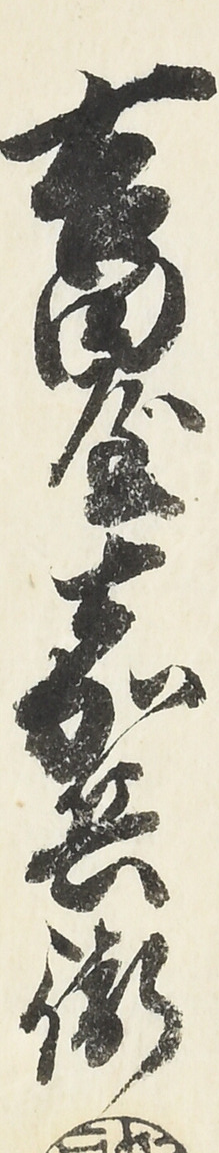吉田屋嘉兵衛㊞
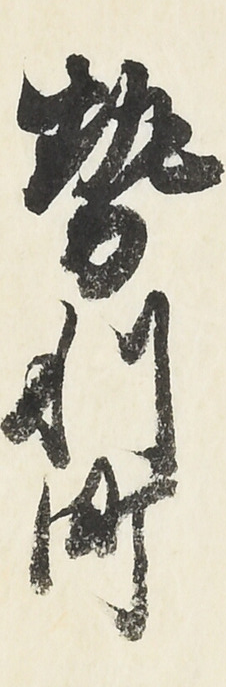勢利町
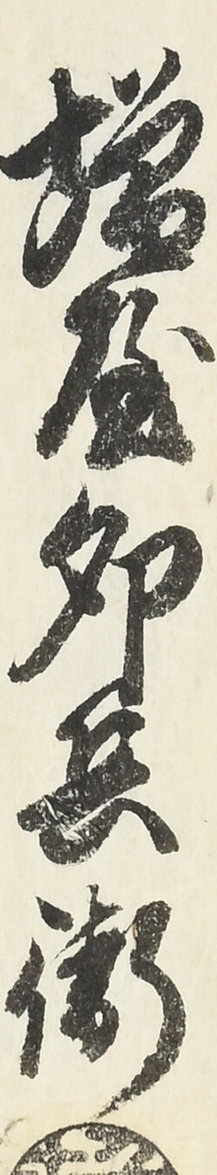増屋卯兵衛㊞
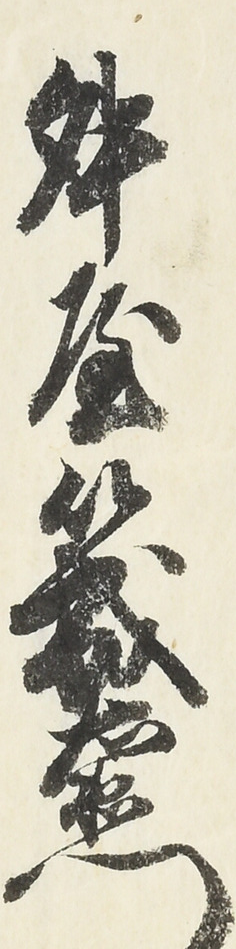升屋幾右衛門㊞

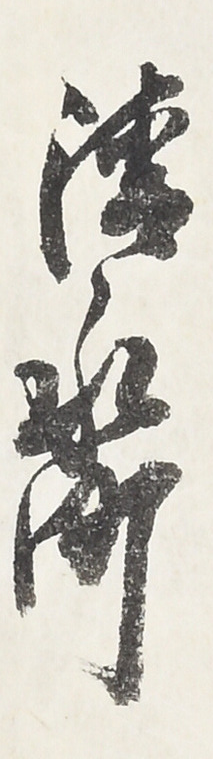清水町
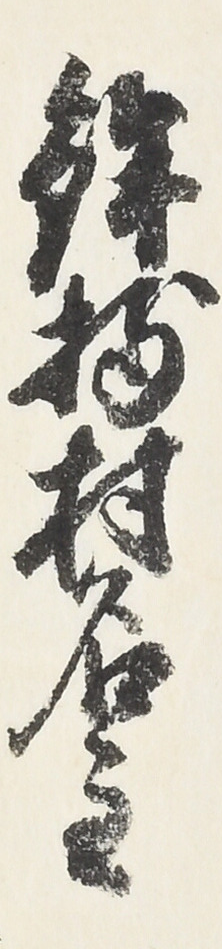鉾持村名主

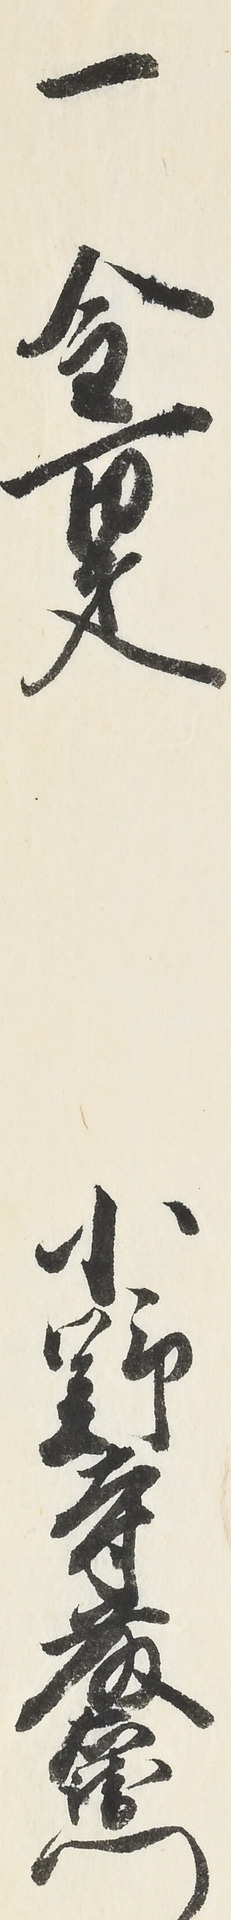一金百疋小野寺藤右衛門
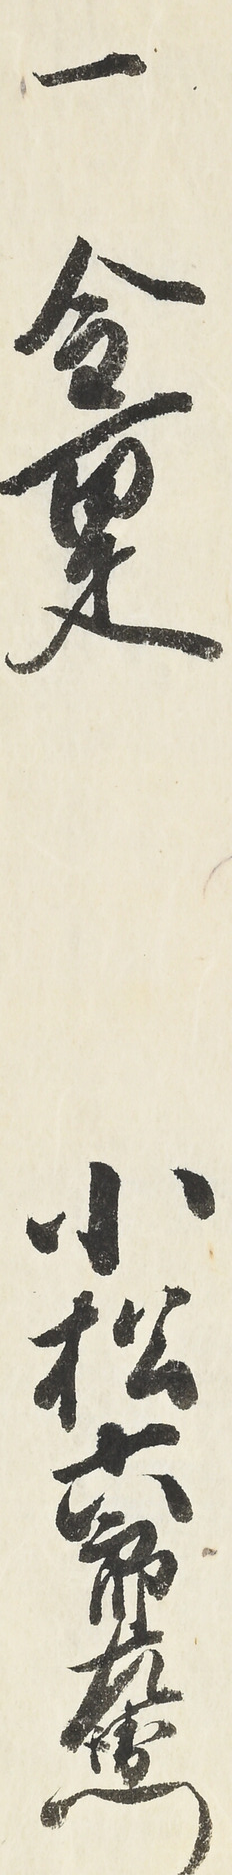一金百疋小松六郎左衛門
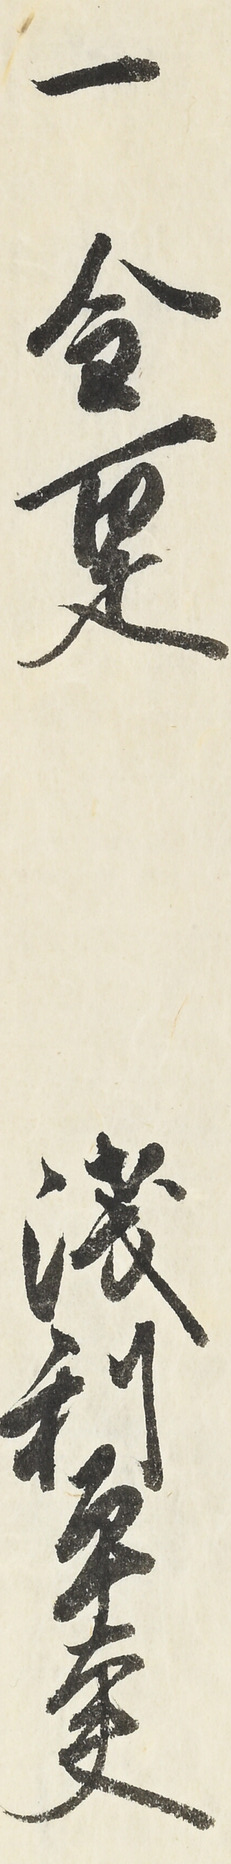一金百疋浅利平太夫

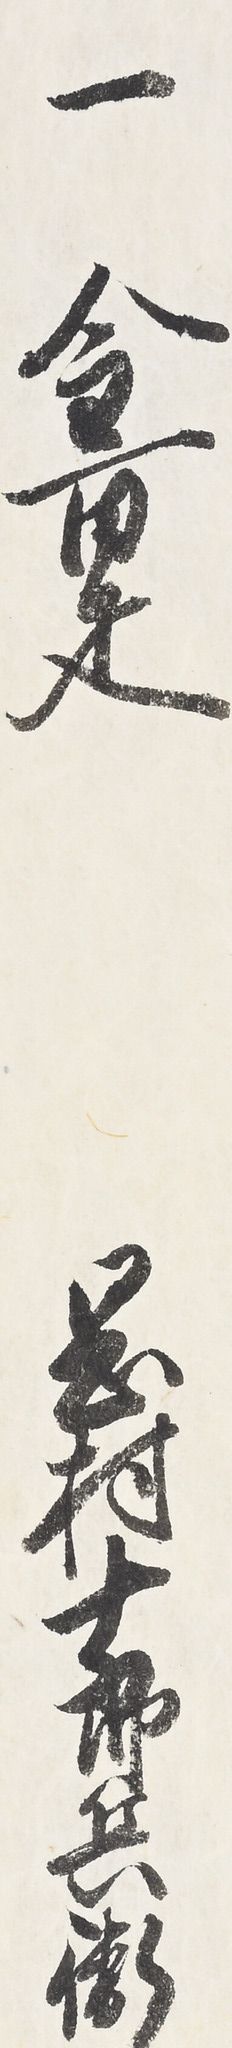一金百疋岡村十郎兵衛
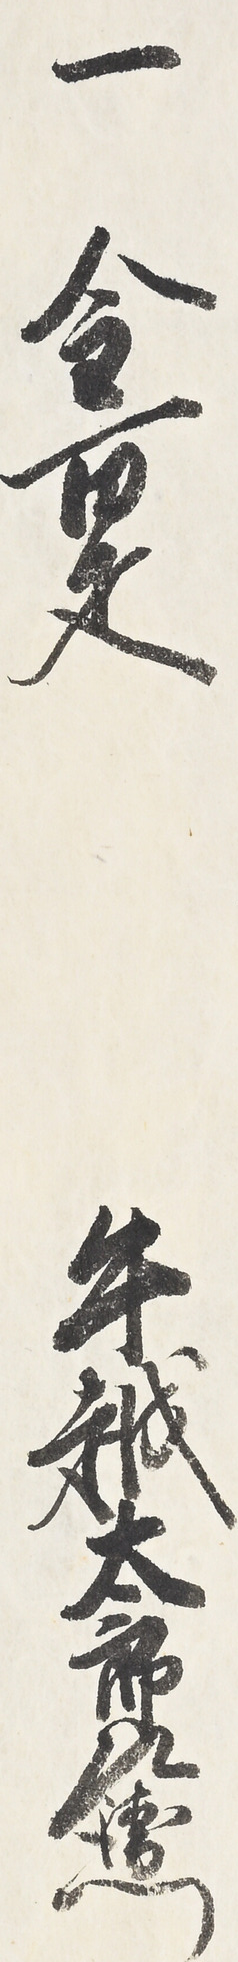一金百疋牛越太郎左衛門
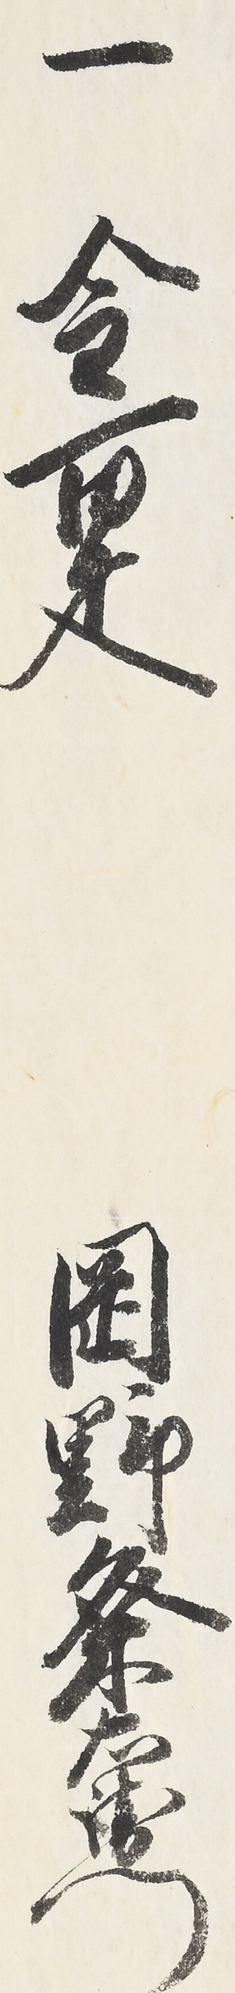一金百疋岡野粂右衛門
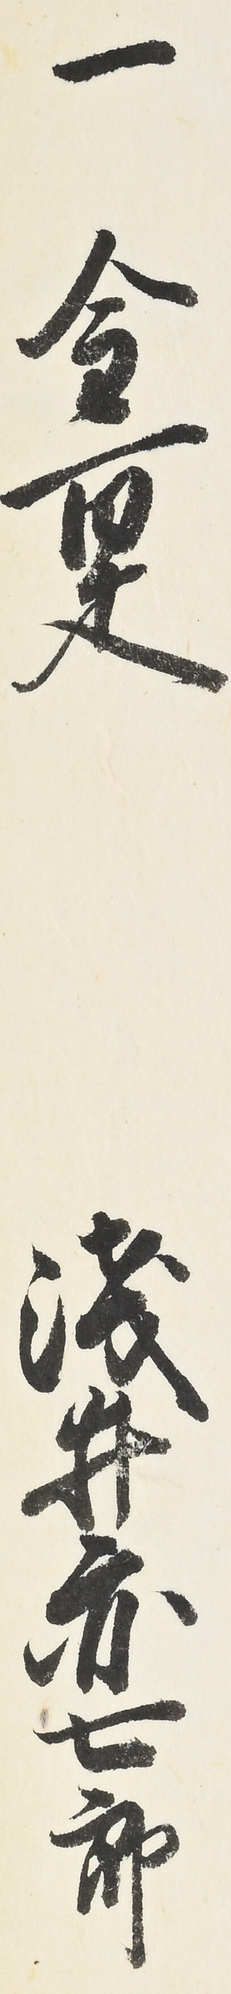一金百疋浅井亦七郎
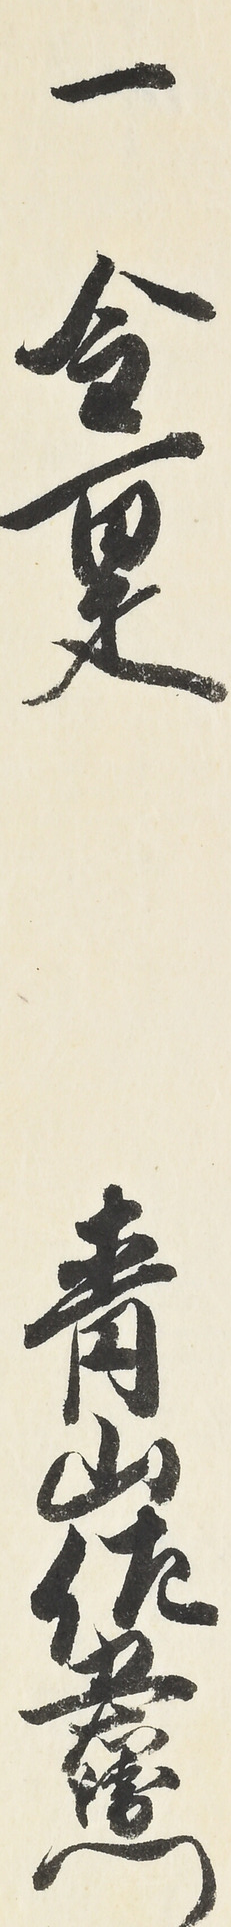一金百疋青山佐五右衛門
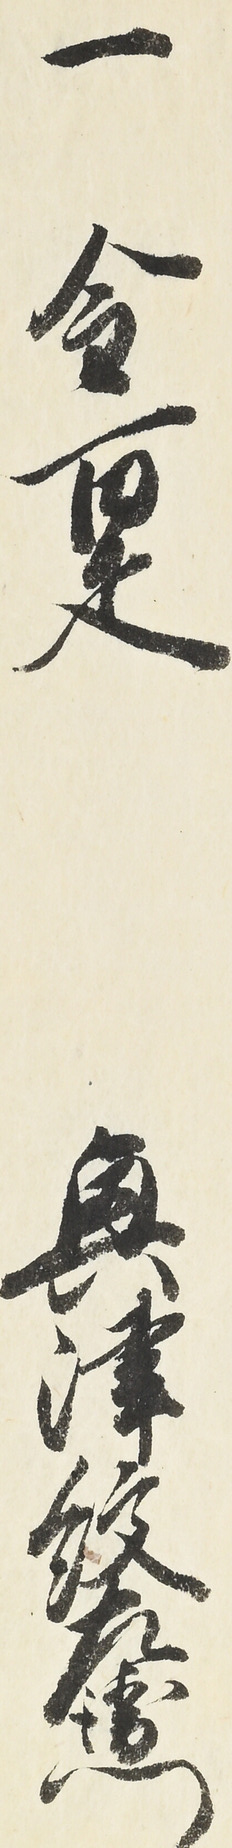一金百疋奥津紋左衛門
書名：永代太々御神楽名前帳
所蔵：伊那市立高遠町図書館・合同会社AMANE
